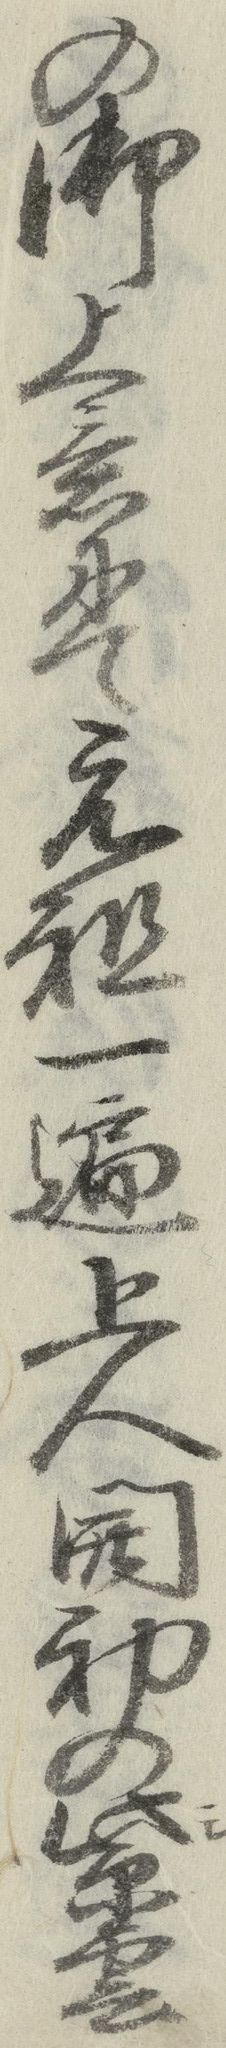の御上意にて元祖一遍上人開初の紫雲

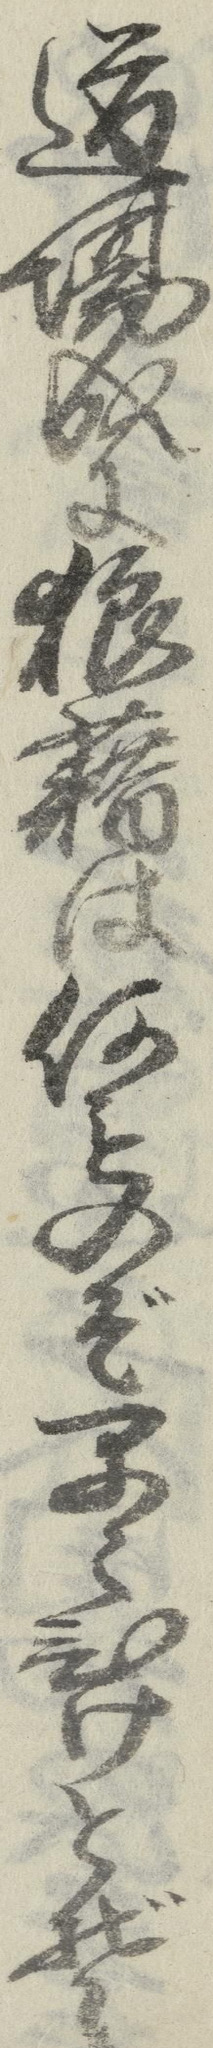道場成に狼藉は何ものぞ早々ひけとぞ
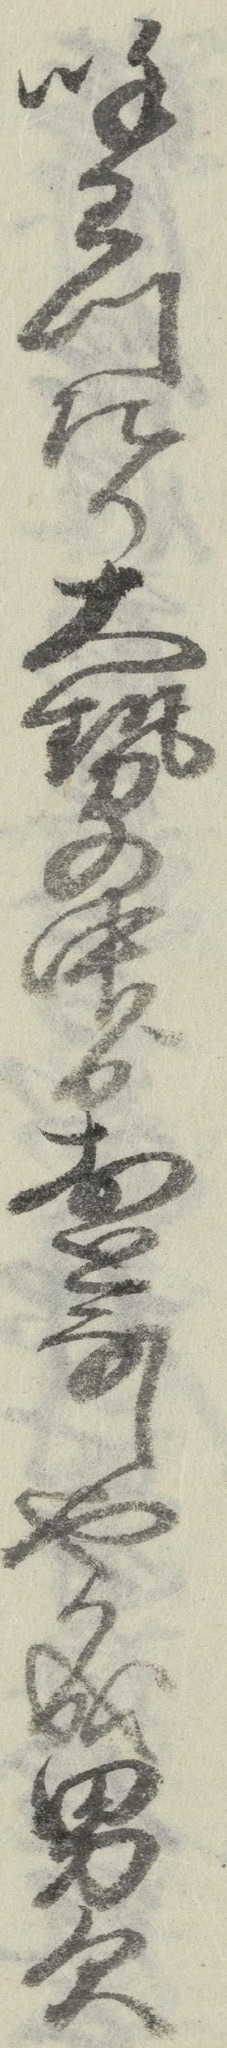呼わつたり大勢の中ゟおとなしやか成男欠
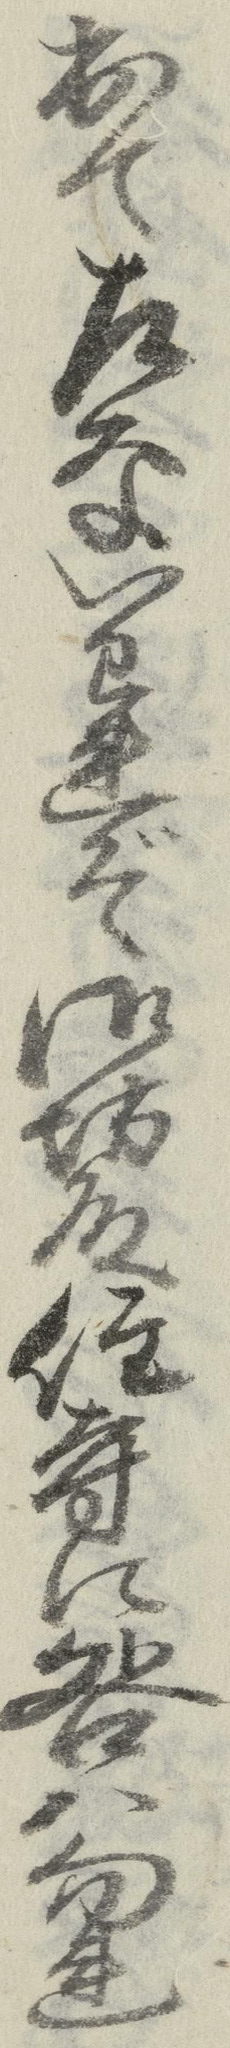出てさないわれぞ御坊殿住寺に咎は勿れ
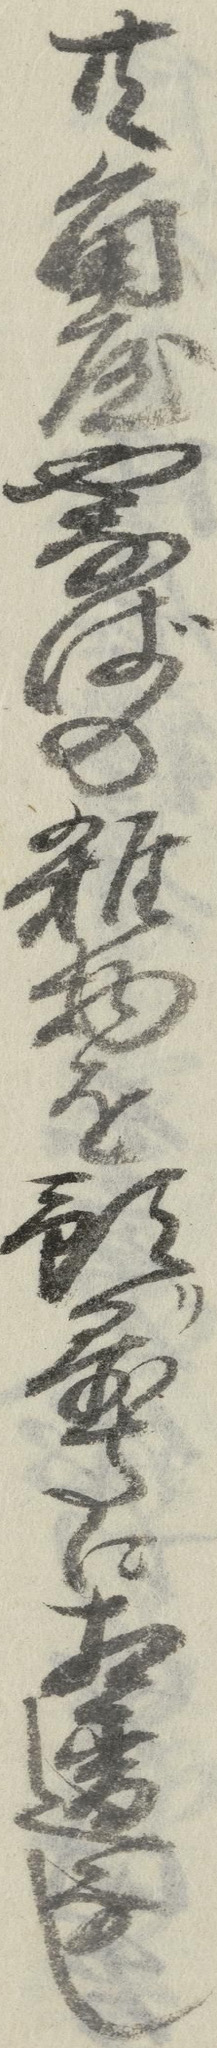共角屋やなばの雑物を預置るに相違なし
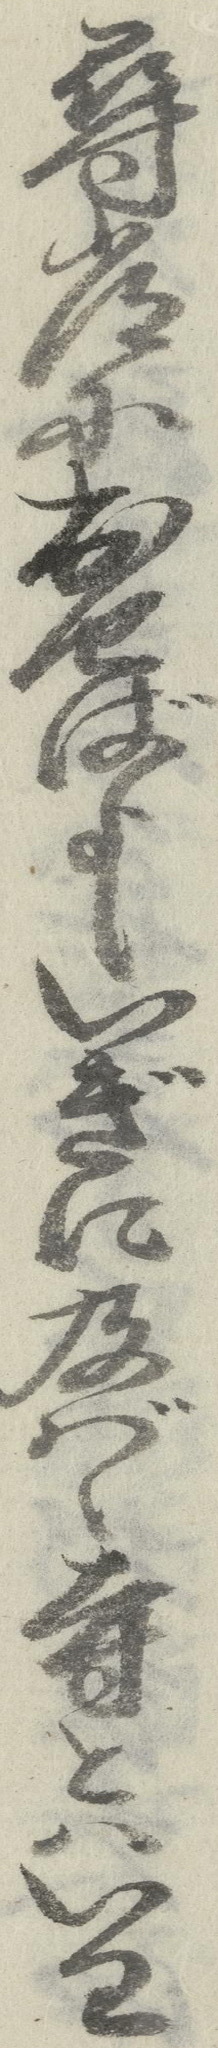尋常に出せばよしいぎに及ばゝ寺とはいわ
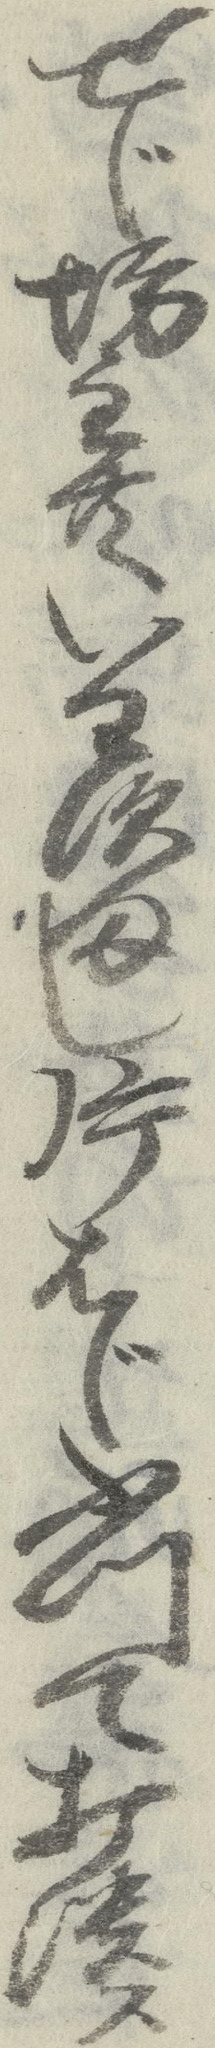せじ坊主共いわすまし片はじふつて打潰ス
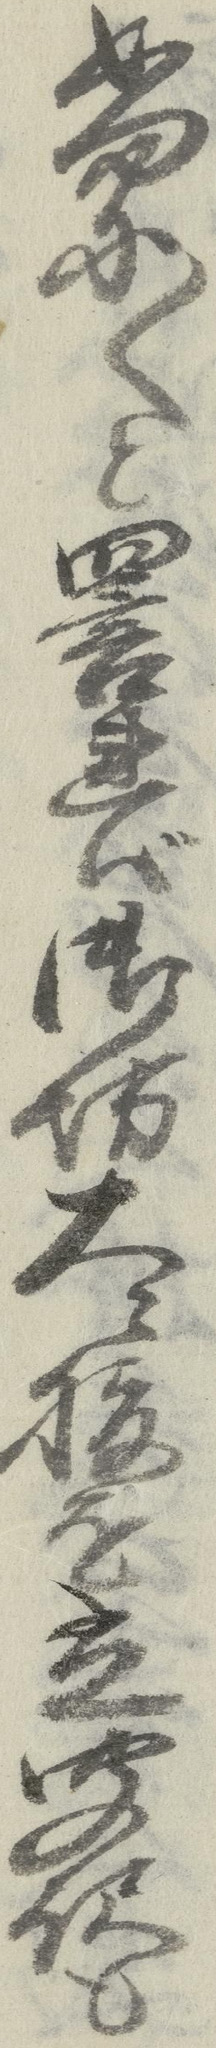如何に〳〵と詈れば御坊大に腹を立聞訳も
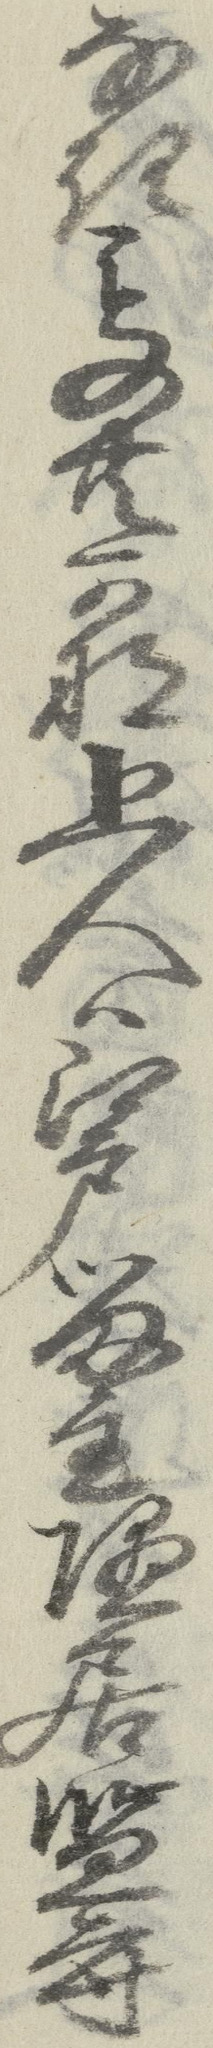なきもの共かな上人は江戸留主隠居監寺
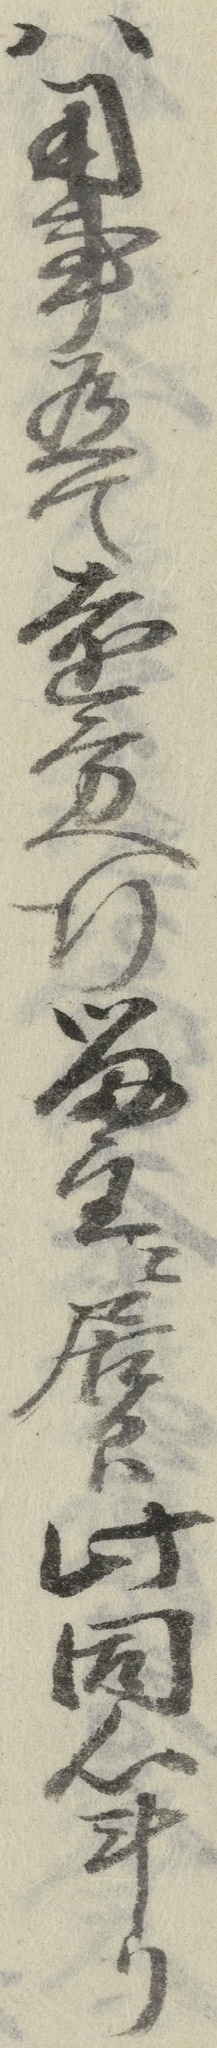は用事有て遠方へ行留主に居るは此同心計り
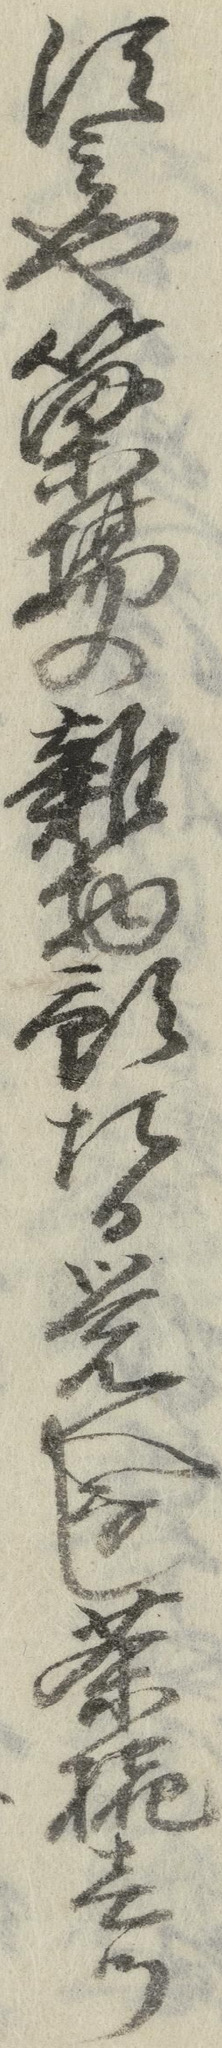すみや簗場の雑物預たる覚へなし茶椀去り
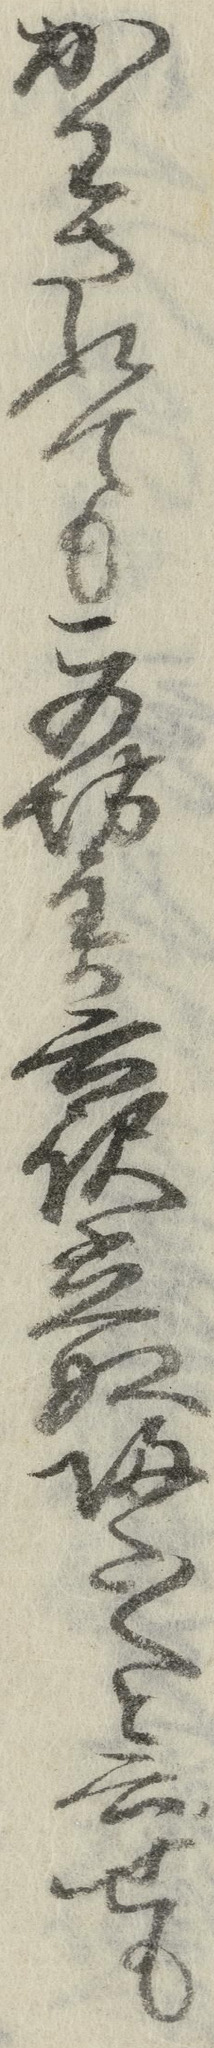かわされてもこの坊主か云訳立ぬ場こ〳〵と云はせも
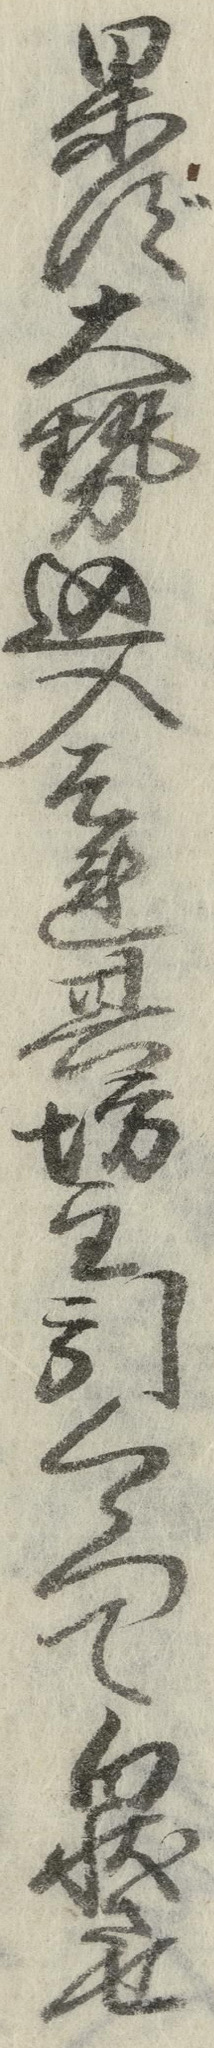果ず大勢込入それ其坊主引くゝつて白状させ
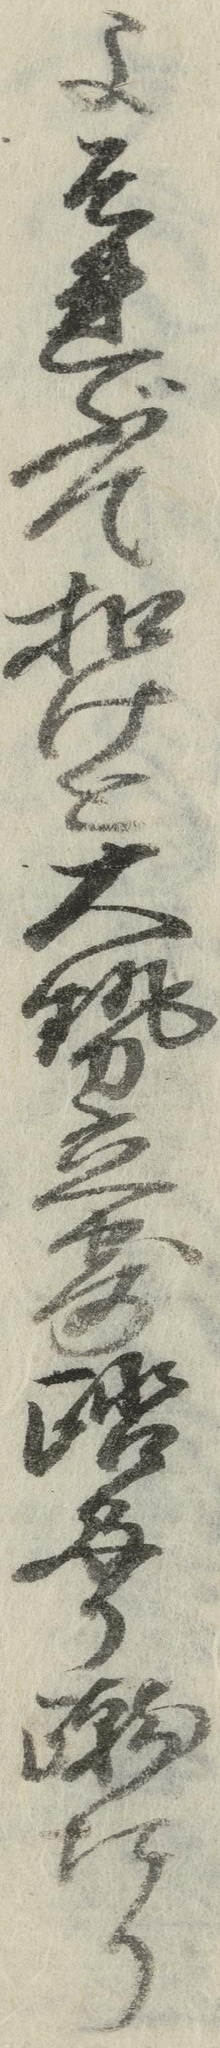よそれぶて扣けと大勢立寄踏たり蹴たり
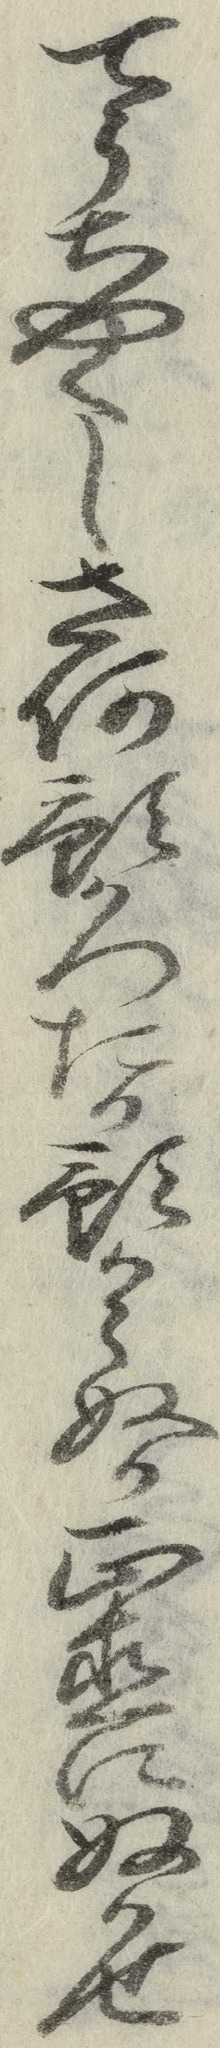てうちやくしさあ預かつたか預からぬか正直にぬかせ
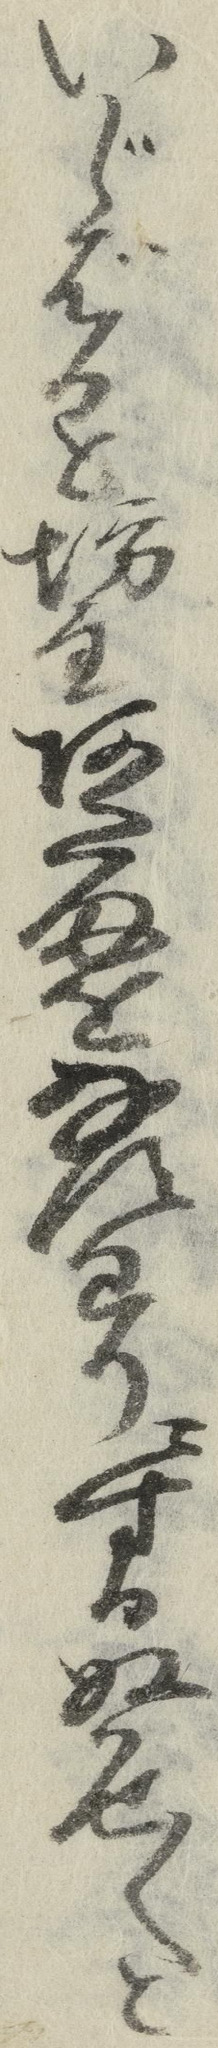いじばると坊主あたまをなすわりにするぬかせ〳〵と
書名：浅間大焼騒動記　中
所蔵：東京大学地震研究所図書室 Earthquake Research Institute Library, The University of Tokyo, JAPAN
